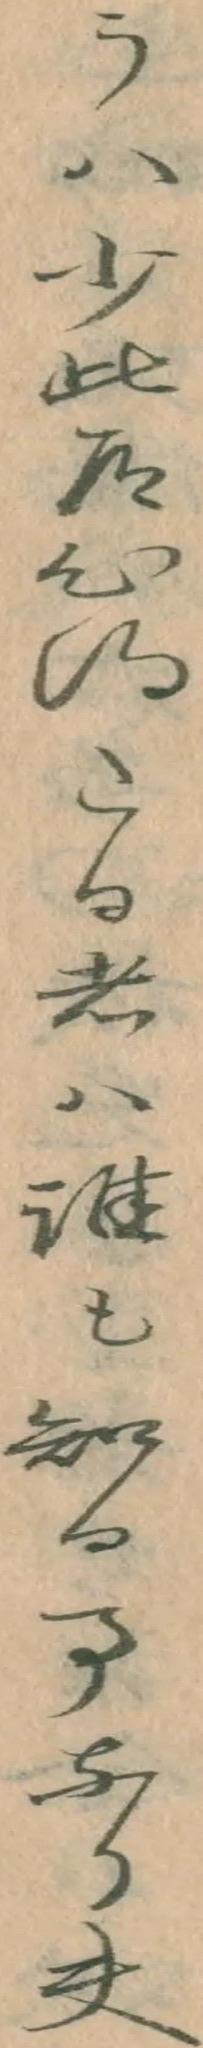うは少此道心得たる者は誰も知る事なり夫
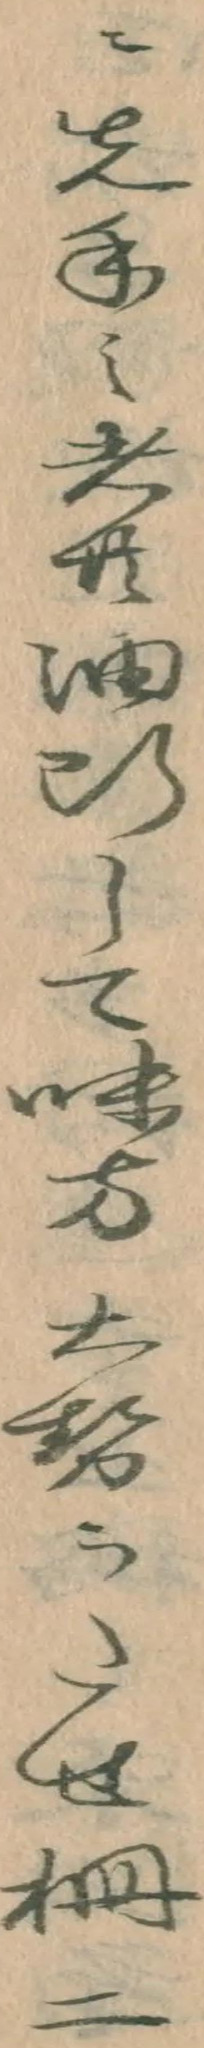に先手之者共油断して味方大勢うたせ柵二
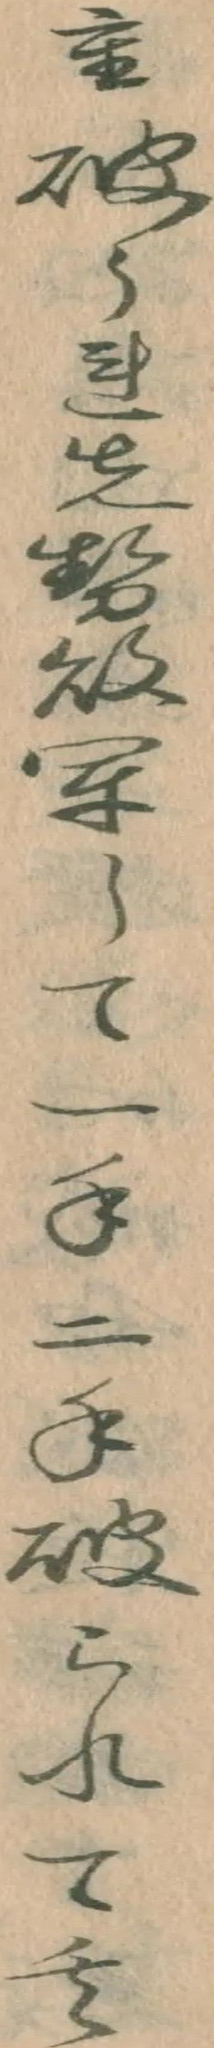重破ら連先勢敗軍して一手二手破られて其
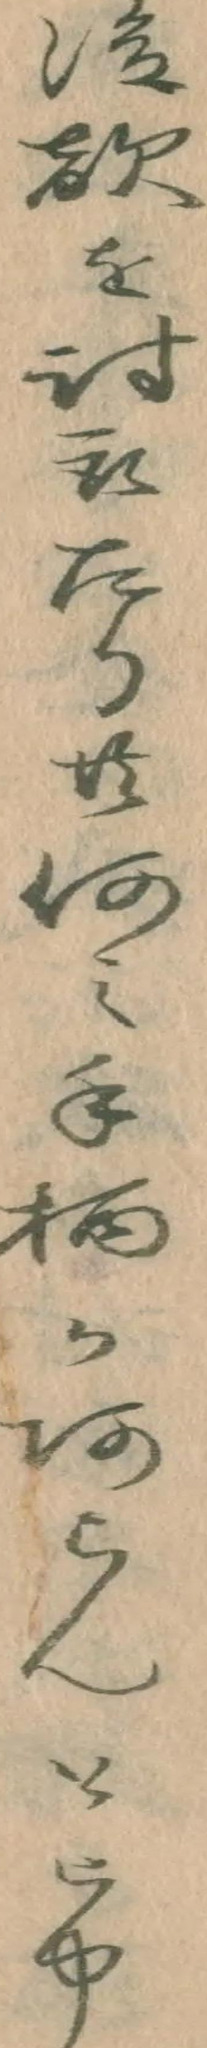後敵を討取たり共何之手柄か阿らんと被申
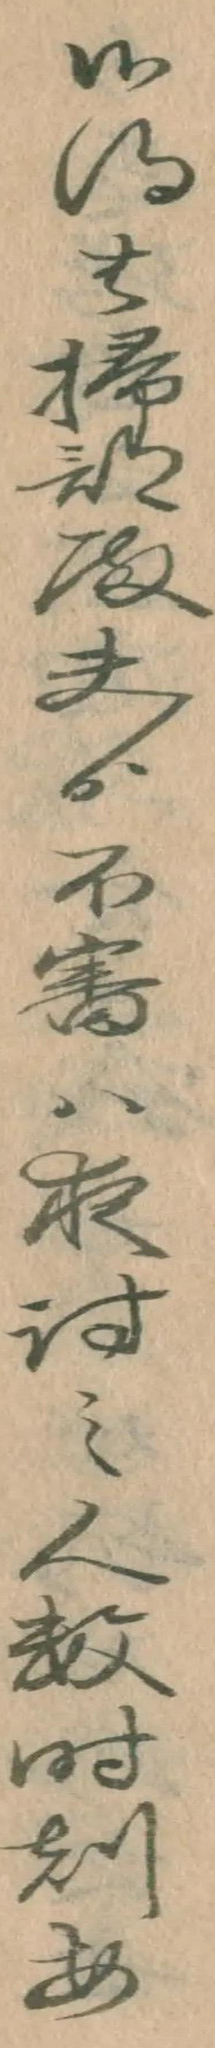候得者掃部殿夫ゟ不審は夜討之人数時刻あ
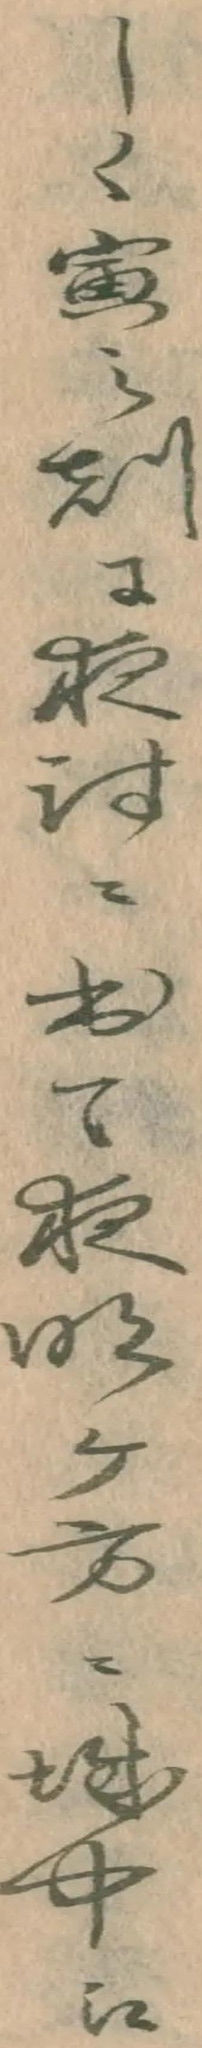しく寅之刻尓夜討に出て夜明け方に城中江
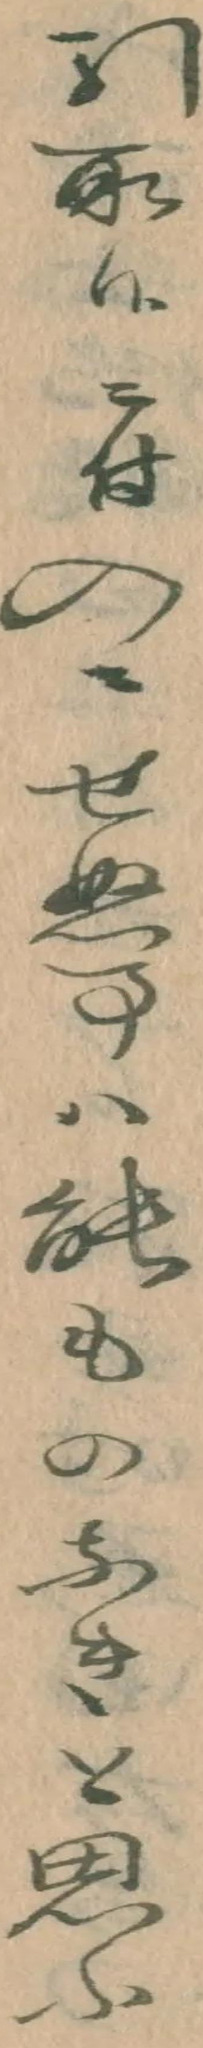引取候に付入にせ怒事は能ものなきと思ふ
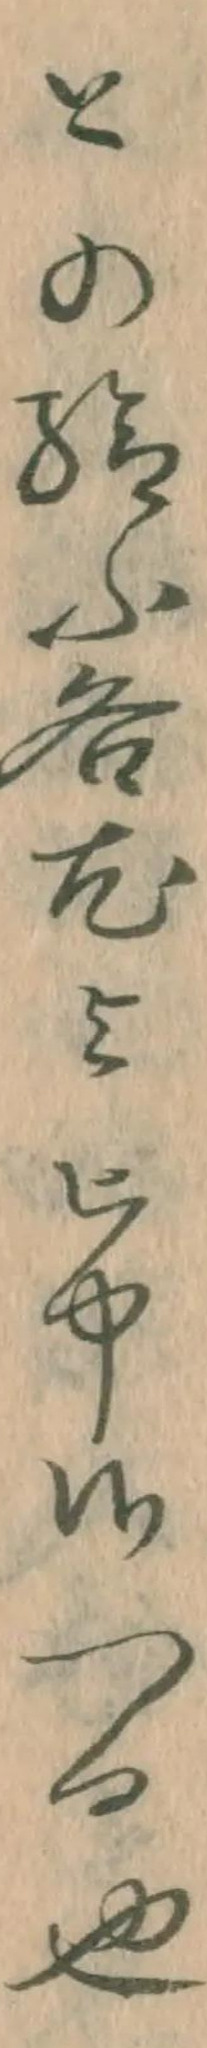との給ふ各尤与被申候つる也
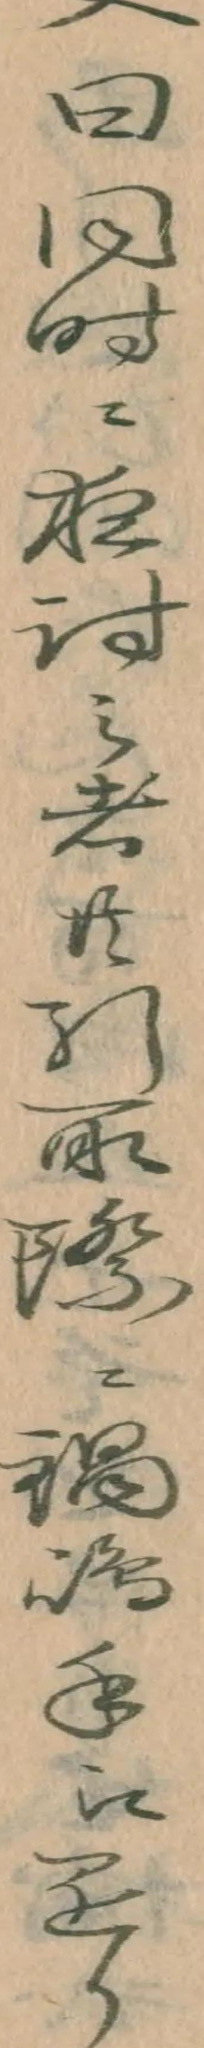又曰同時に夜討之者共引取際に鍋島手江懸り
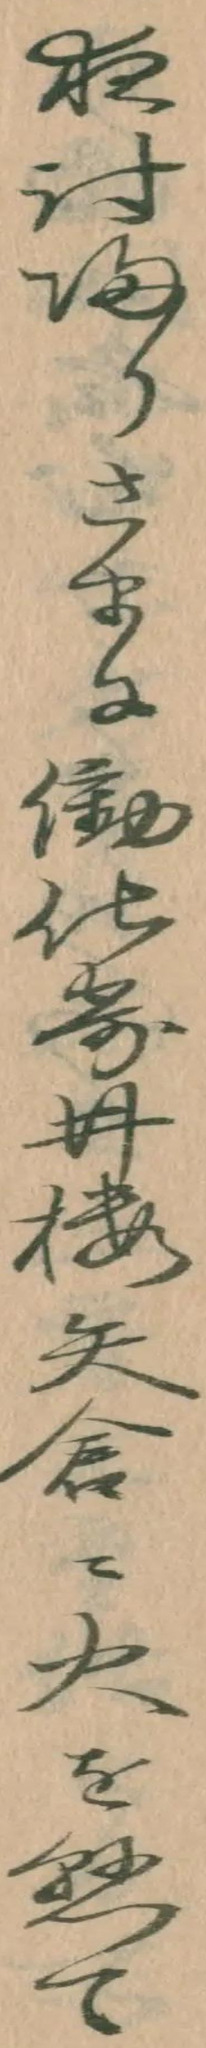夜討帰りさま尓働仕寄井樓矢倉に火を懸て
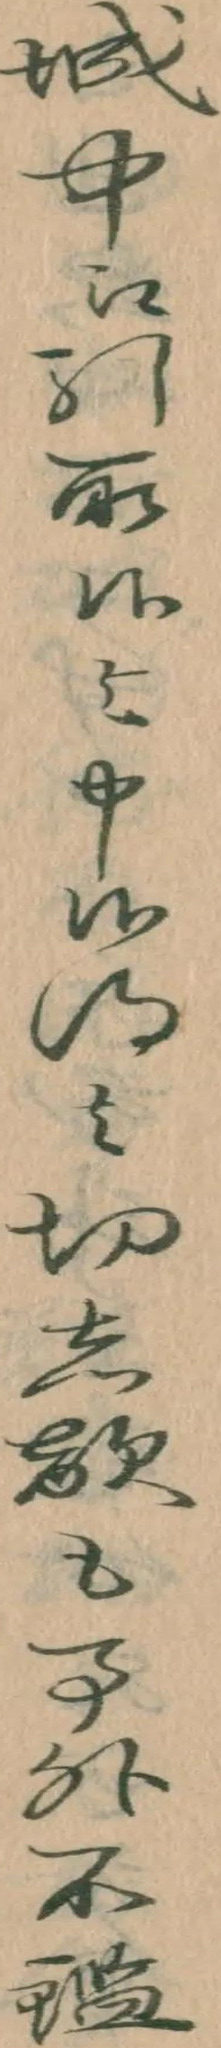城中江引取候与申候得者切志敵も事外不鑑
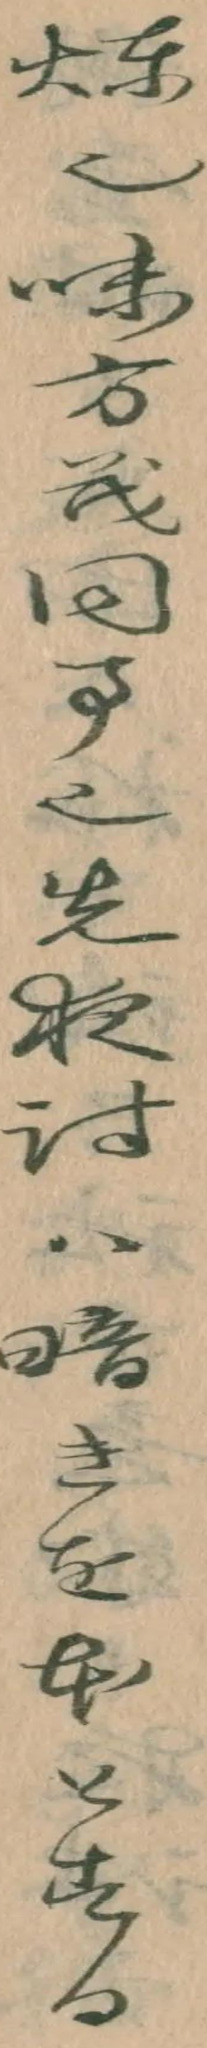煉也味方茂同事也先夜討は暗きを本と春る
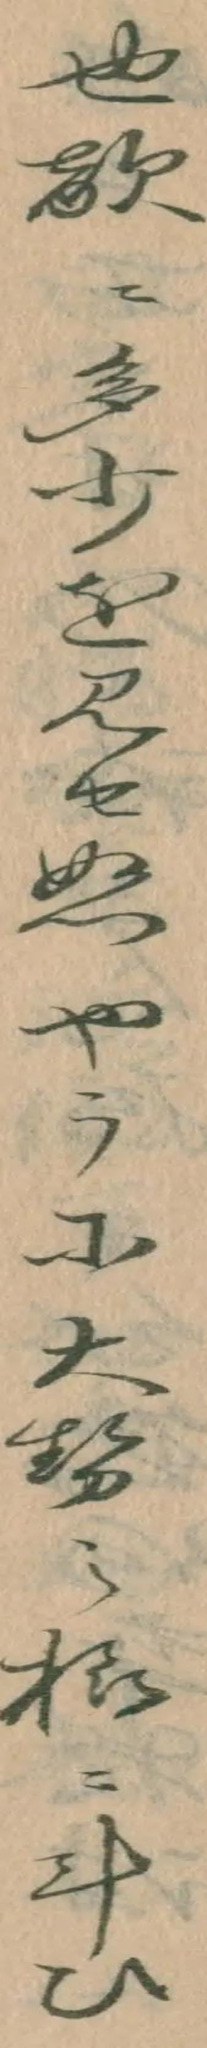也敵に多少を見せ怒やう尓大勢之様に斗ひ
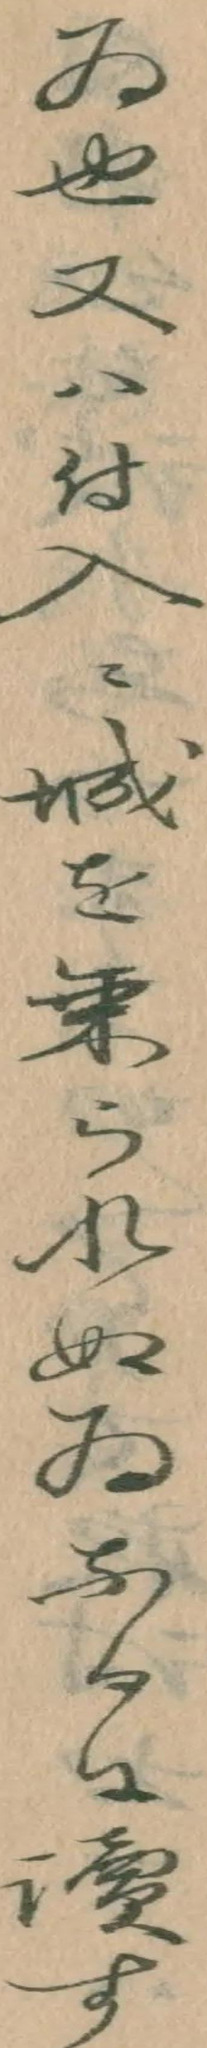ゐ也又は付入に城を乗られぬゐなか尓読す
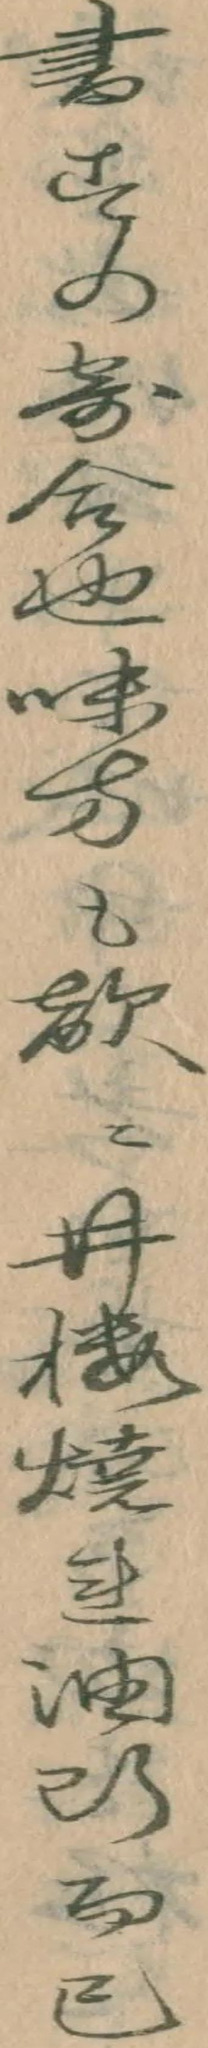書春の寄合也味方も敵に井樓焼連油断而已
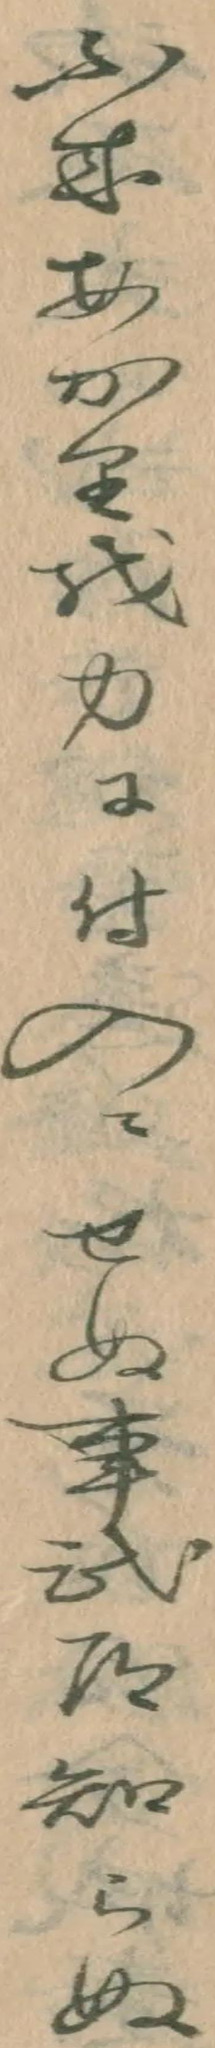ふ成あか里越力尓付入にせぬ事武道知らぬ
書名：切支丹御退治記 49巻. [7]
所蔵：国立国会図書館 National Diet Library, JAPAN
